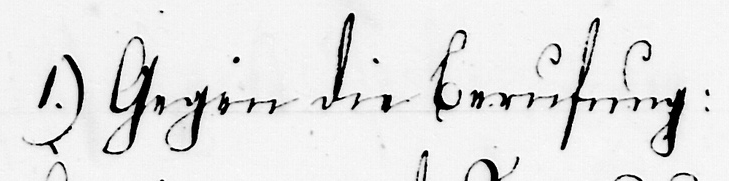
1.) Gegen die Berufung:
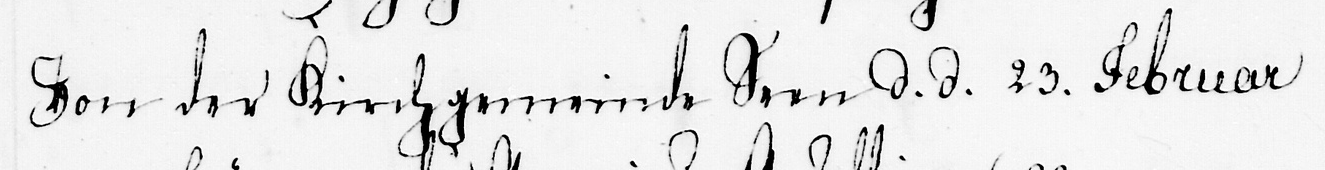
Von der Kirchgemeinde Seen d. d. 23. Februar
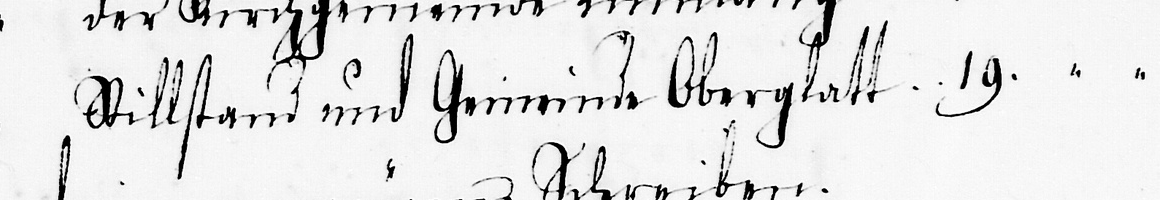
tillstand und Gemeinde Oberglatt 19. “
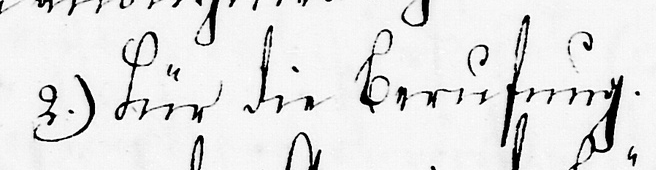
2.) Für die Berufung.
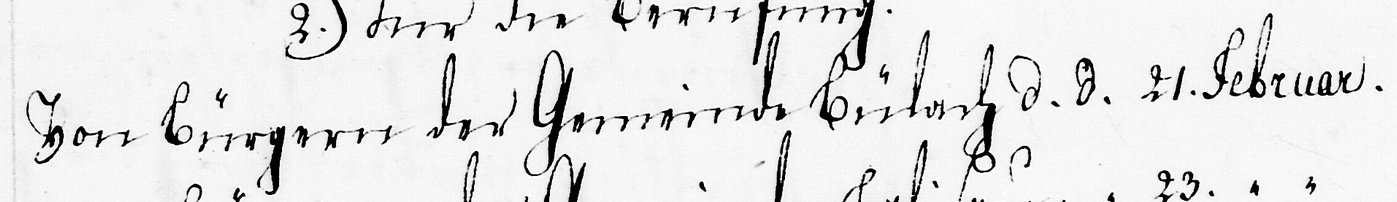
Von Bürgern der Gemeinde Bülach d. d. 21. Februar.
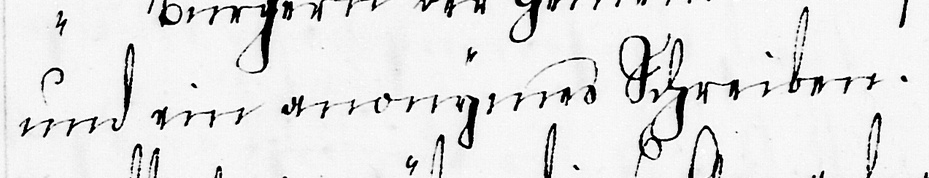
und ein anonymes Schreiben.
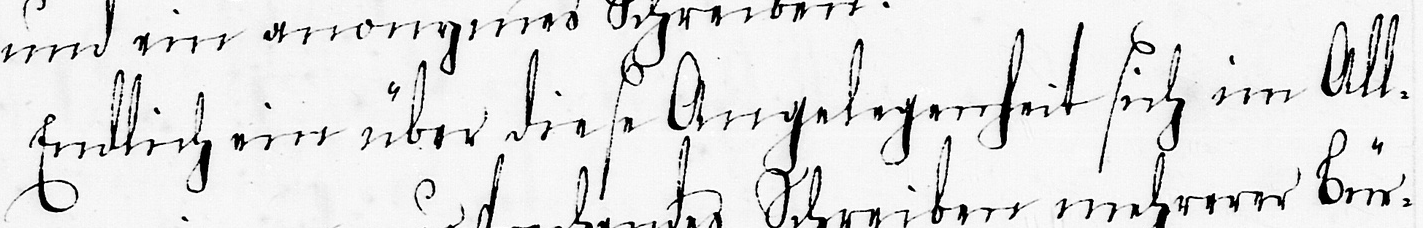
Endlich ein über diese Angelegenheit sich im All¬
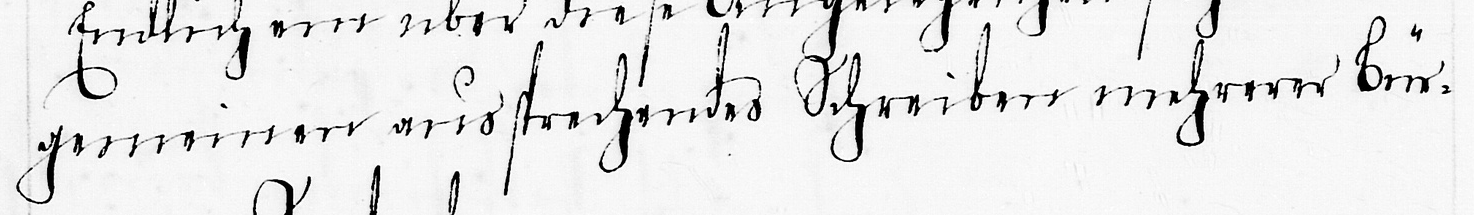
gemeinen aussprechendes Schreiben mehrerer Bür¬
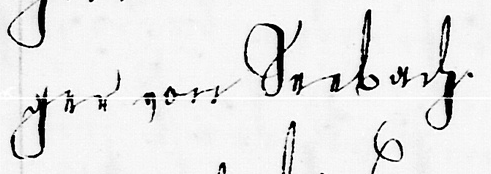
ger von Seebach.
